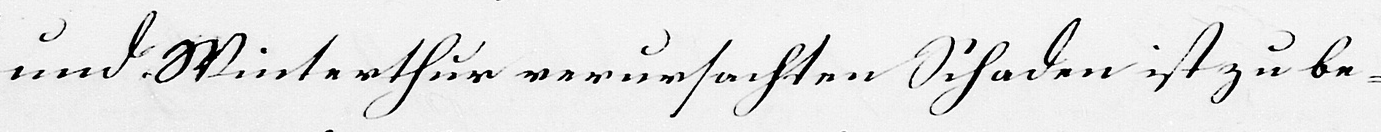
und Winterthur verursachten Schaden ist zu be¬
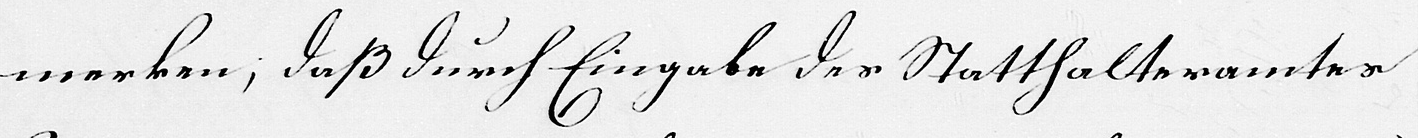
merken, daß durch Eingabe des Statthalteramtes
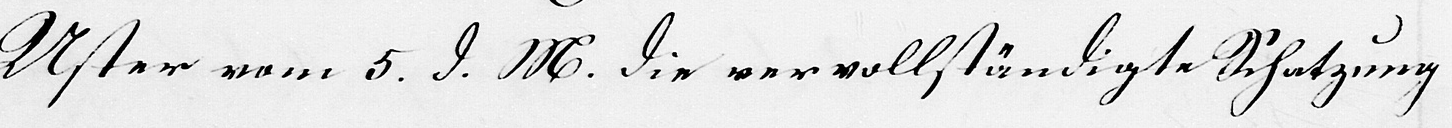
Uster vom 5. d. M. die vervollständigte Schatzung
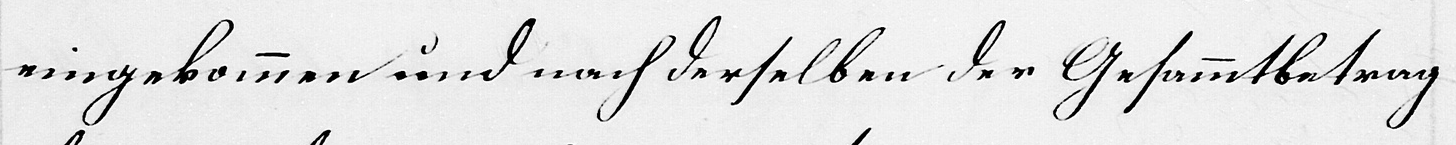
eingekommen und nach derselben der Gesammtbetrag
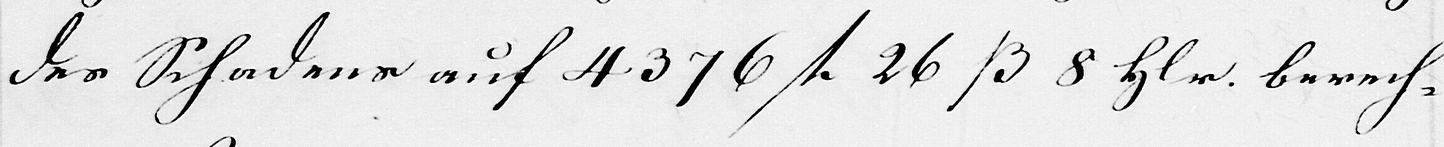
des Schadens auf 4376 fl 26 ß 8 Hlr. berech¬
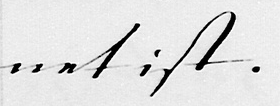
net ist.
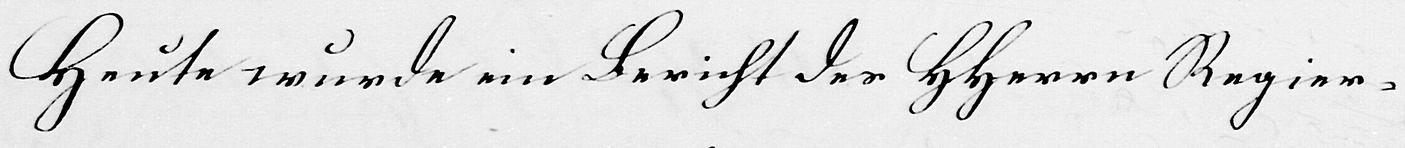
Heute wurde ein Bericht des HHerrn Regier¬
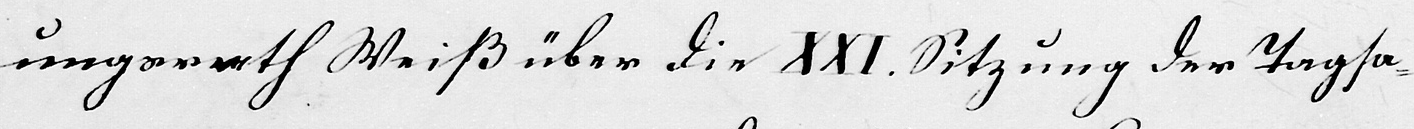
ungsrath Weiß über die XXI. Sitzung der Tagsa¬
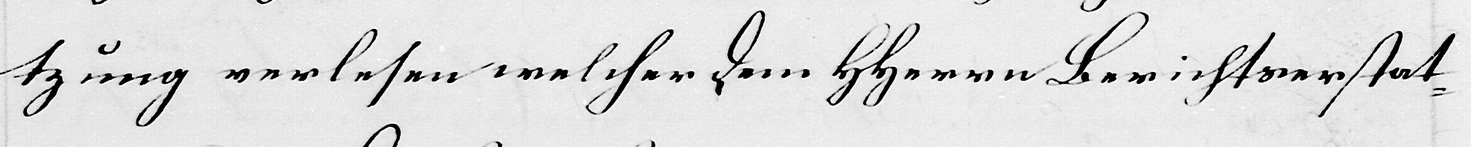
tzung verlesen welcher dem HHerrn Berichtserstat¬
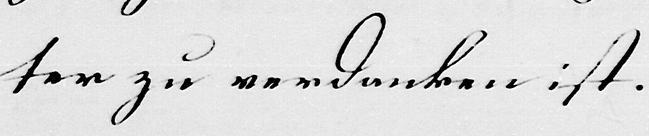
ter zu verdanken ist.
